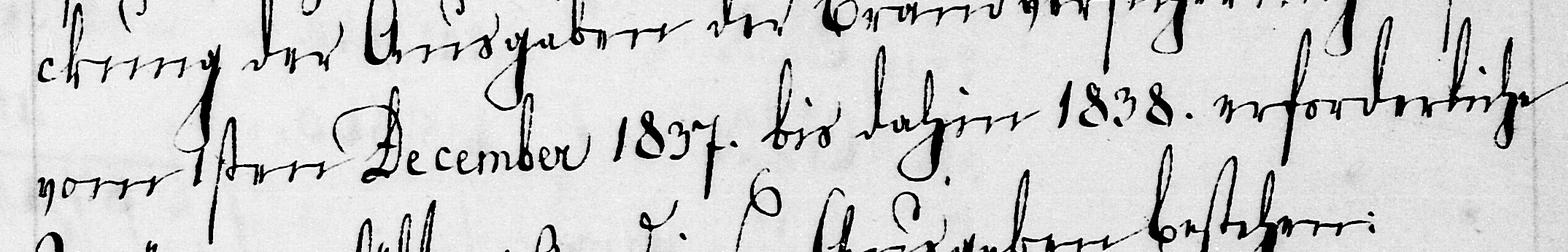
vom 1sten December 1837. bis dahin 1838. erforderliche
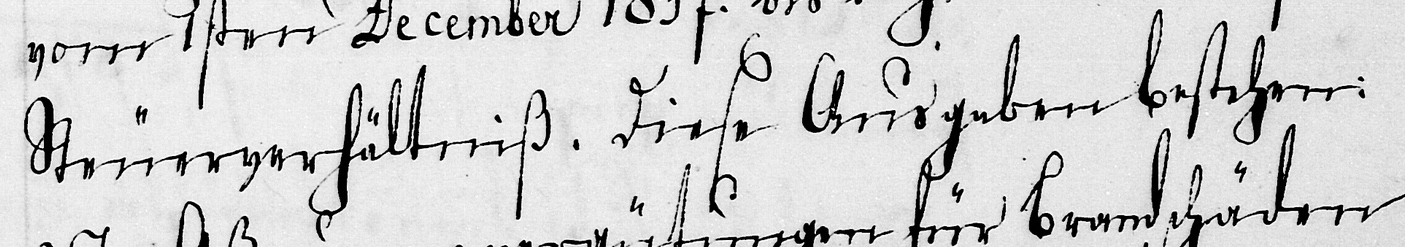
Steuerverhältniß. Diese Ausgaben bestehen:
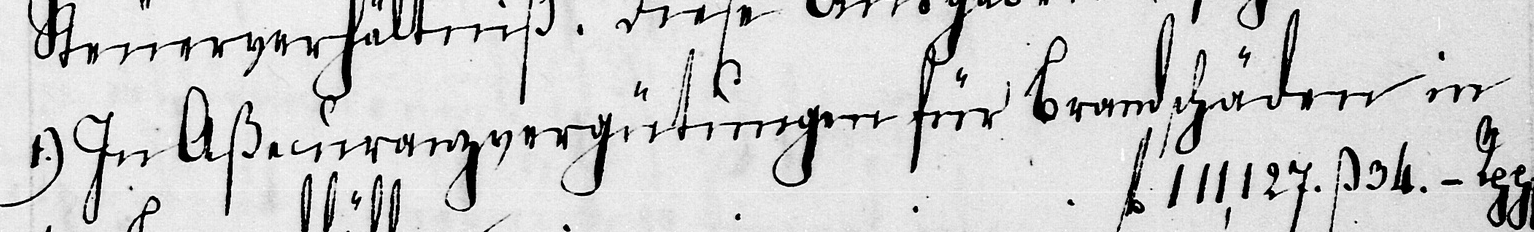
1.) In Aßecuranzvergütungen für Brandschäden in
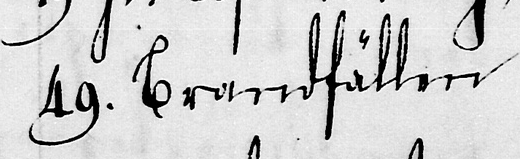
49. Brandfällen
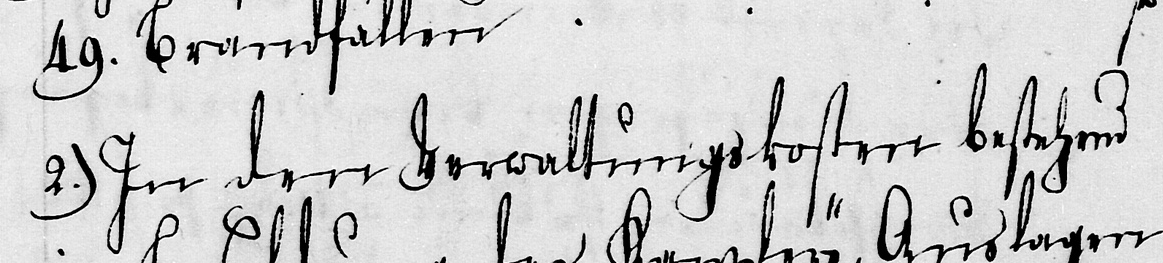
2.) In den Verwaltungskosten bestehend
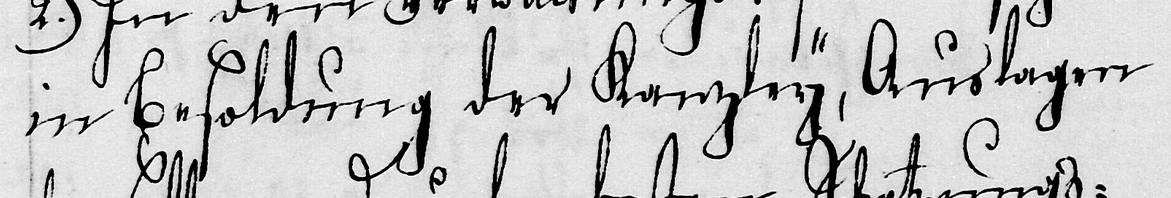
in Besoldung der Kanzley, Auslagen
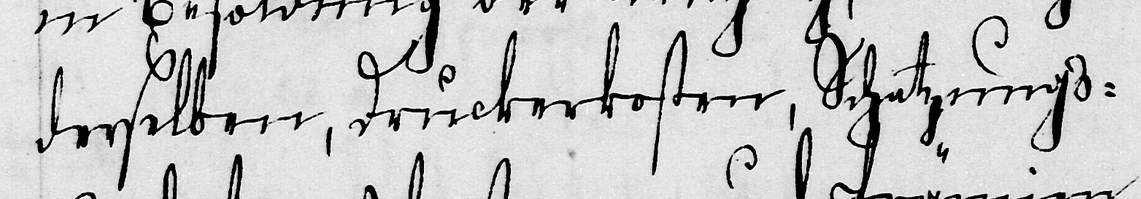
derselben, Druckerkosten, Schatzungs-
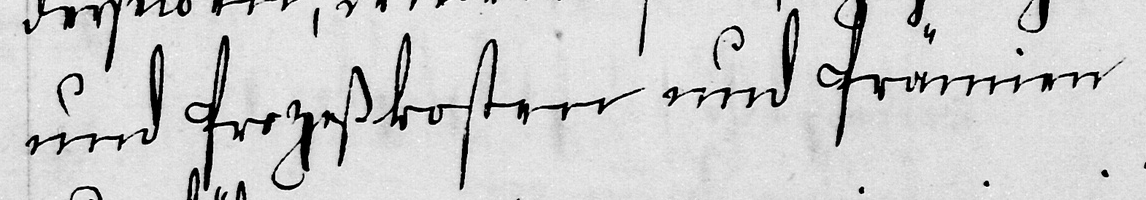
und Prozeßkosten und Prämien
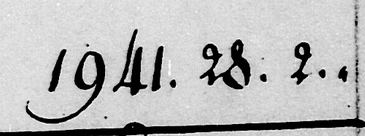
1941. 28. 2.
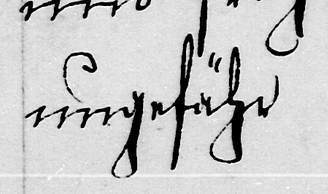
ungefähr
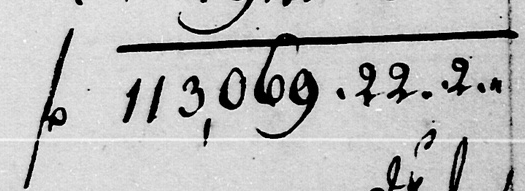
fl. 113,069. 22. 2.
